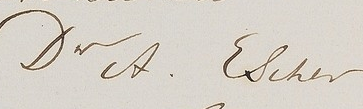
Dr A. Escher
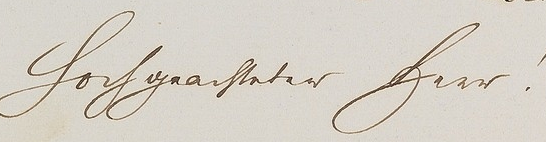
Hochgeachteter Herr!
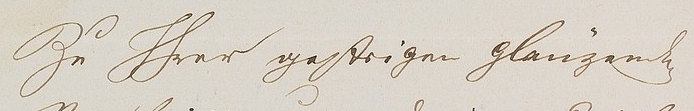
Zu Ihrer gestrigen glänzenden
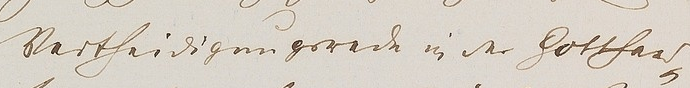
Vertheidigungsrede in der Gotthard -
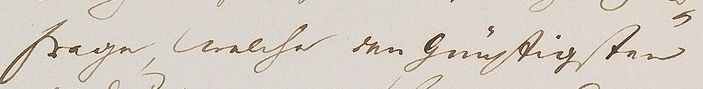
frage, welche den günstigsten
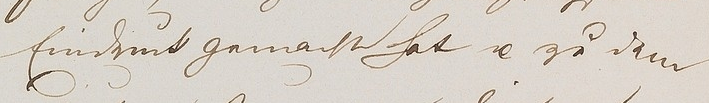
Eindruck gemacht hat & zu dem
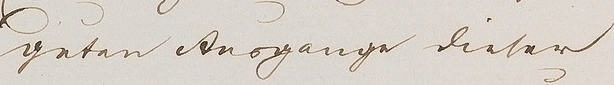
guten Ausgange dieser
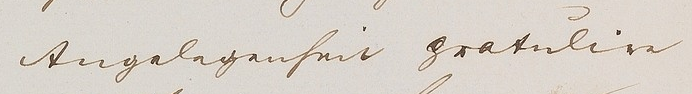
Angelegenheit gratulire
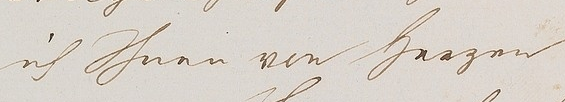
ich Ihnen von Herzen.
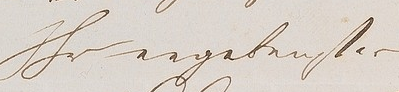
Ihr ergebenster
